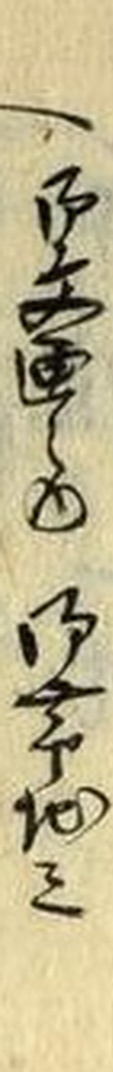御文匣之内御帯地三
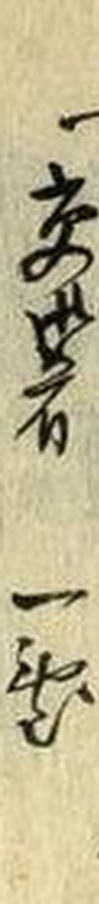交御肴一台
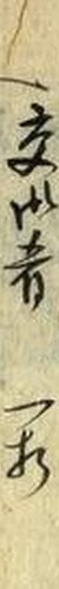交御肴一台
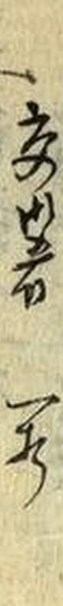交御肴一台
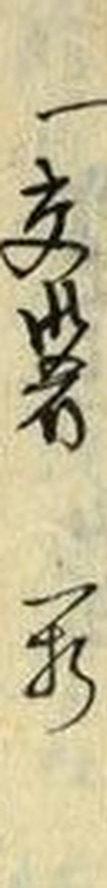交御肴一台
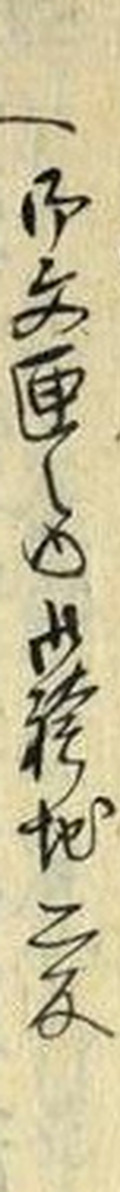御文匣之内御帯地三
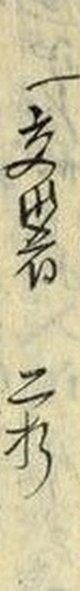交御肴壱折
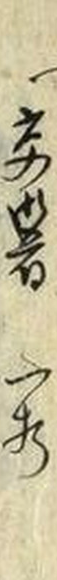交御肴一台
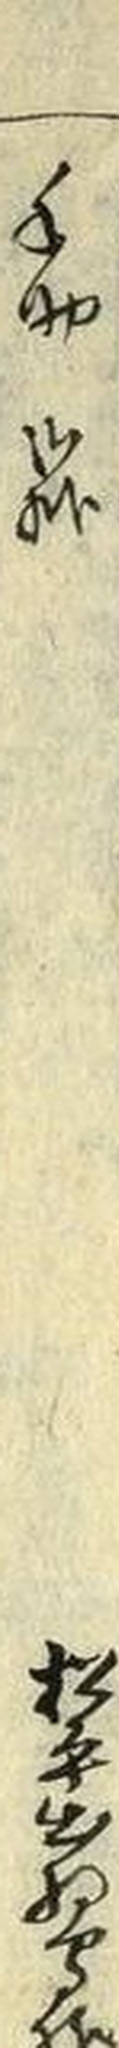手助弐掛松平出羽守様
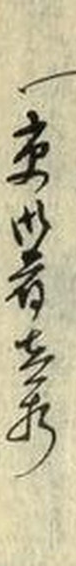交御肴壱折

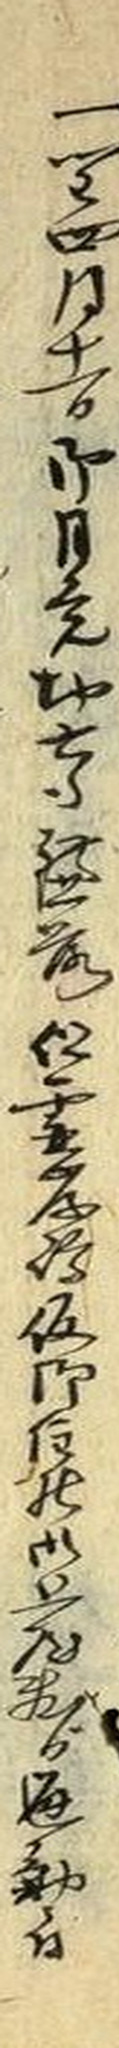一閏四月十一日御目覚切六ツ鎌落但霊岸嶋仮御住居御上屋敷ゟ通勤ニ付
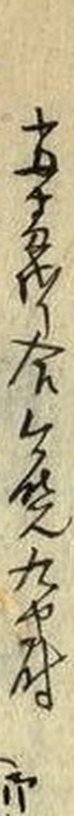当番代り合今暁九半時
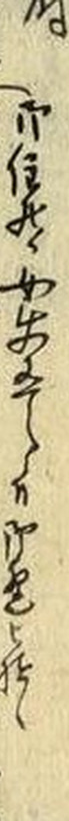御住居へ女使有之候付御逢被遊候
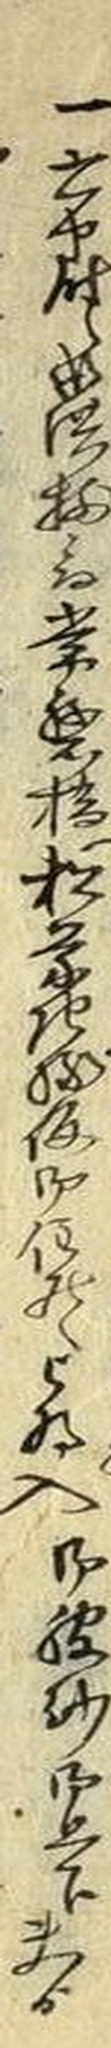一六半時御供揃ニ而常磐橋松栄院様仮御住居へ被為入御服紗御上下夫ゟ
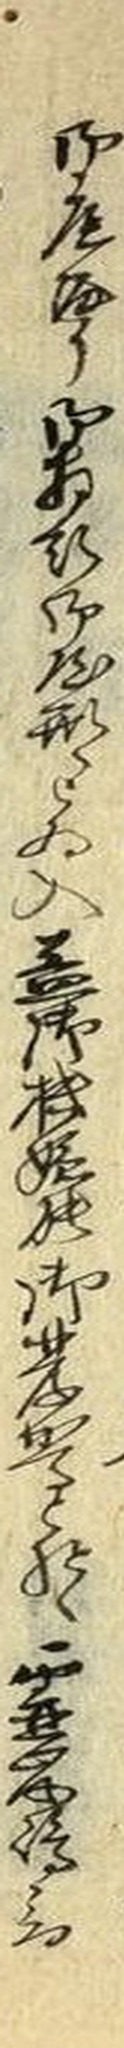御庭通り御拝領御屋形へ被為入益御機嫌能御発駕被遊候霊岸嶋ニ而
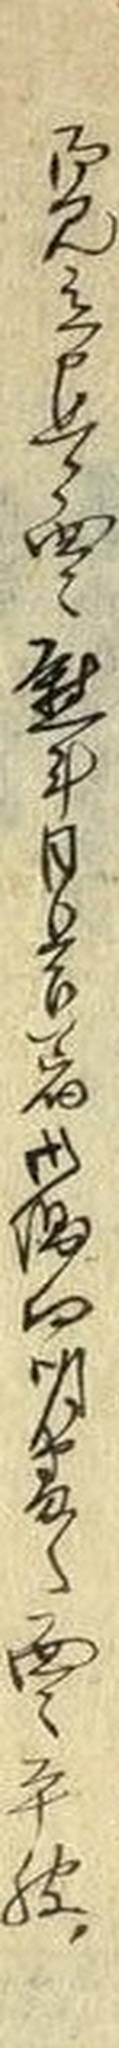御見立申上候面々熨斗目上下着御側向明番之面々平服
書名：少傅日録抄（斉善付側向頭取日記、江戸并道中、初入在国、逝去後…
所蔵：福井県文書館 Fukui Prefectural Archives
